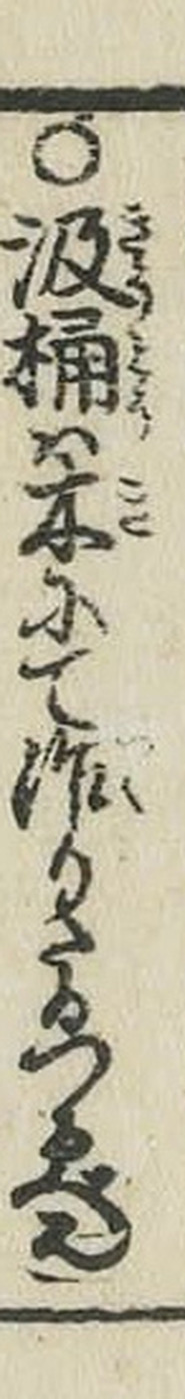○汲桶は木にて作りたるつるべ也
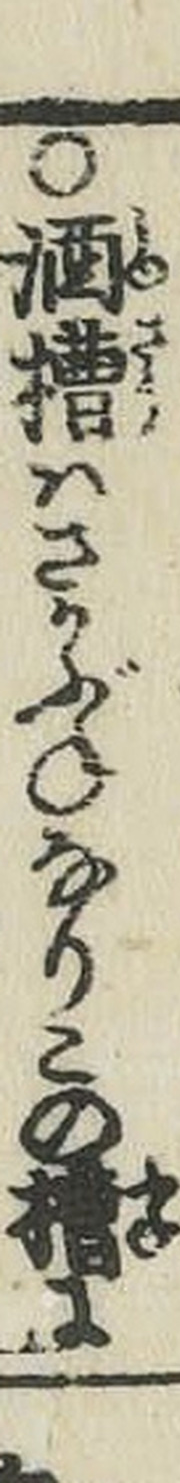○酒槽はさかぶねなりこの槽に
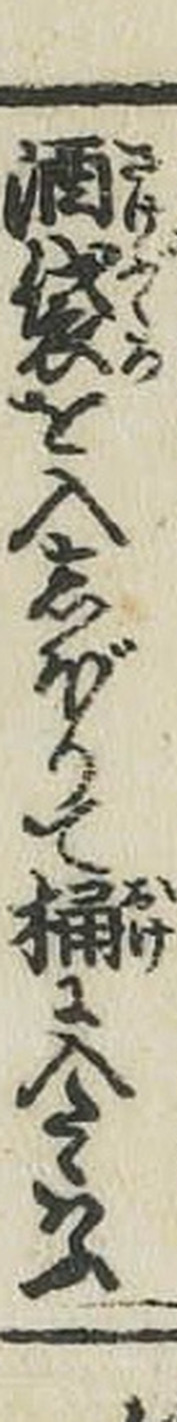酒袋を入しぼりて桶に入たくはふ
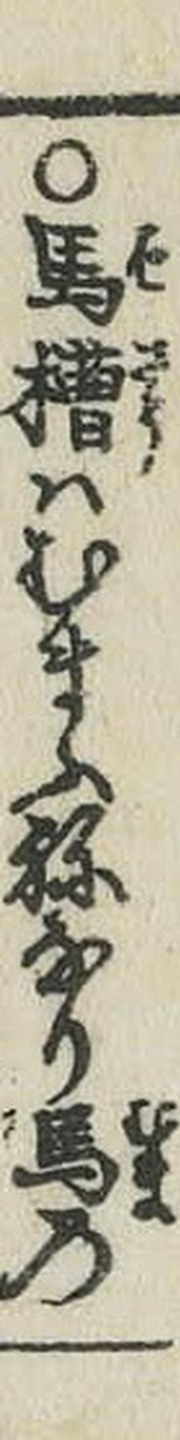○馬槽はむまふねなり馬の
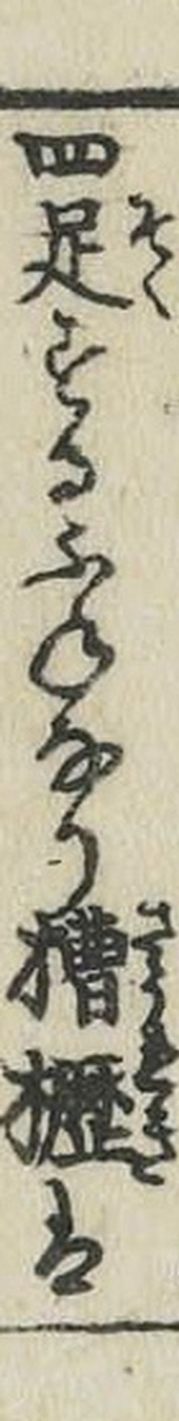四足するふねなり槽櫪は
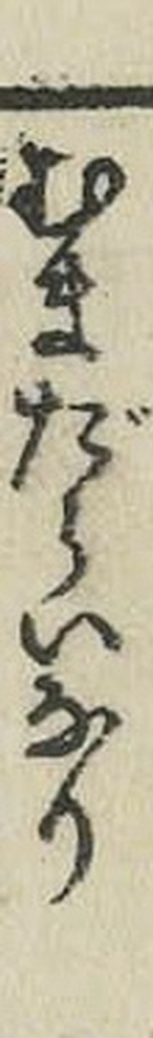むまだらいなり

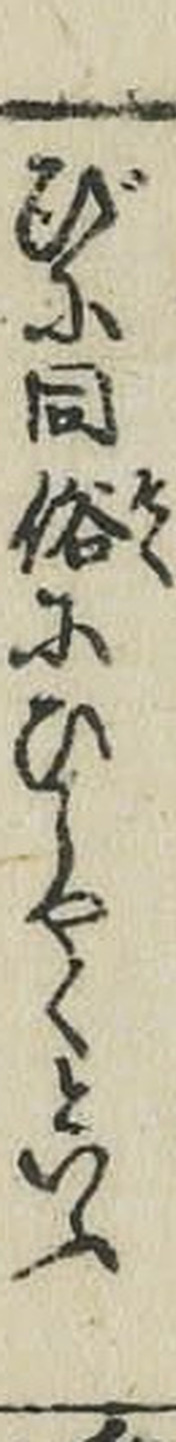びに同俗にひしやくといふ
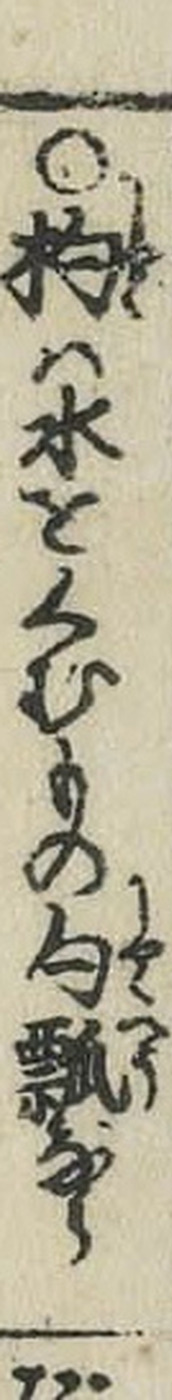○杓は水をくむもの勺瓢なら
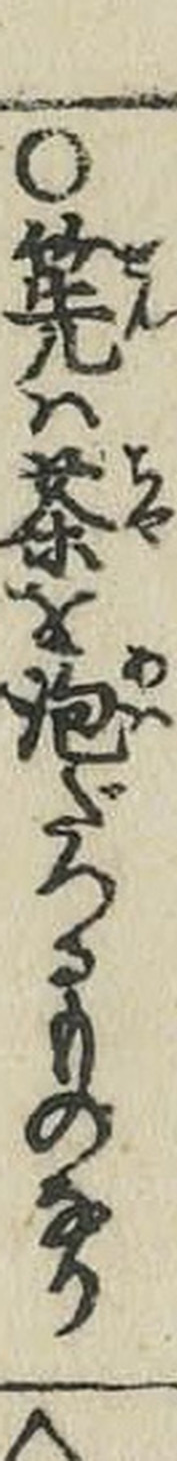○筅は茶を泡だつるものなり
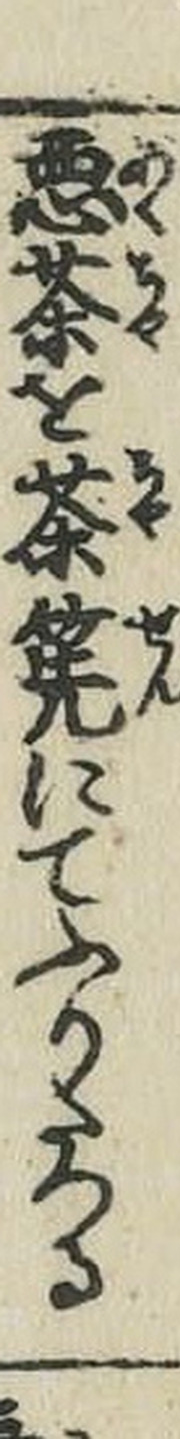悪茶を茶筅にてふりたつる
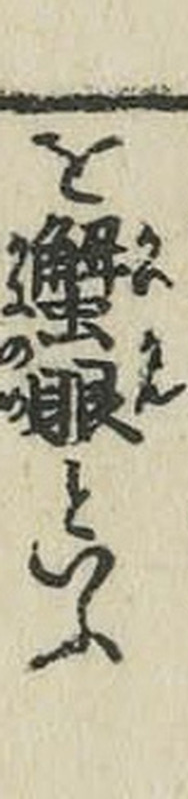を蟹眼といふ
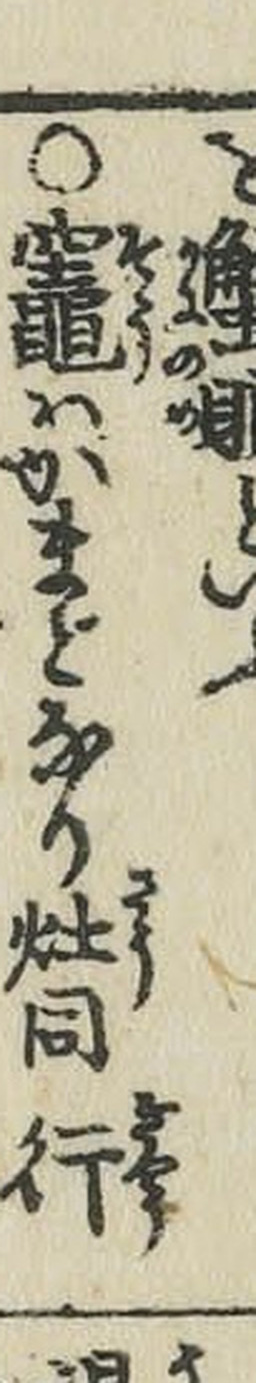○竃はかまどなり灶同行
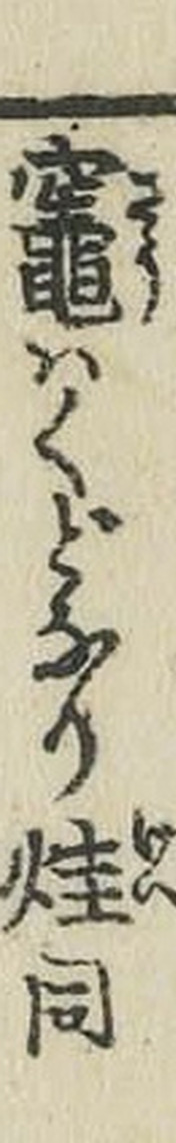竃はくどなり烓同
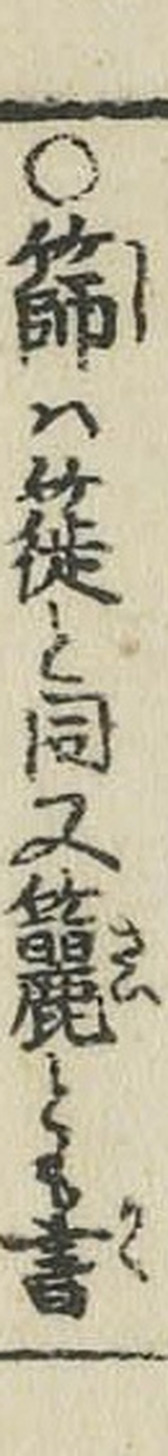○篩は簁と同又籭とも書
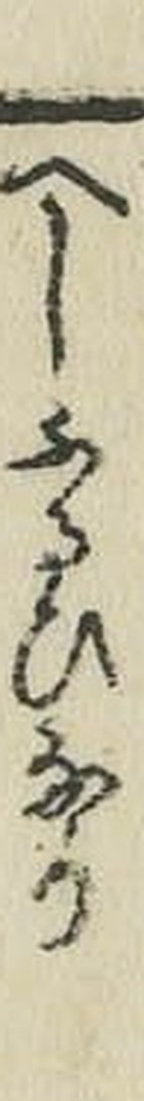へしふるひなり
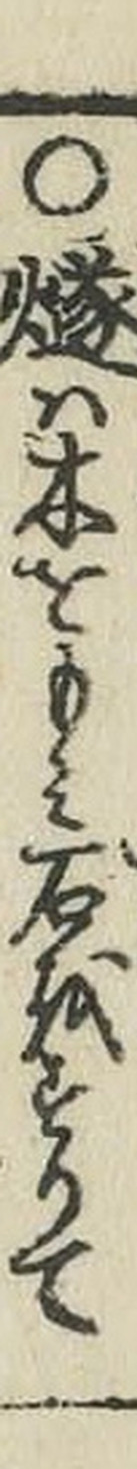○燧は木をもみ石をすりて
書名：増補頭書訓蒙図彙大成 10巻 5:巻之9-11
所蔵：東京学芸大学教育コンテンツアーカイブ
